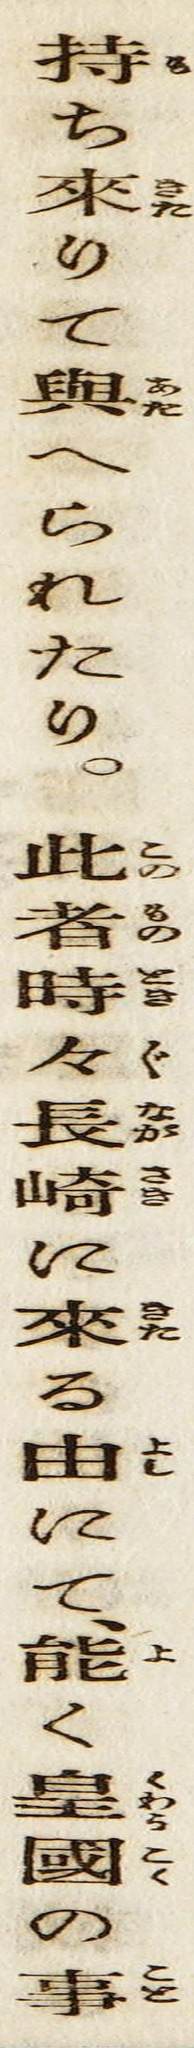持ち来りて与へられたり。此者時々長崎に来る由にて、能く皇国の事
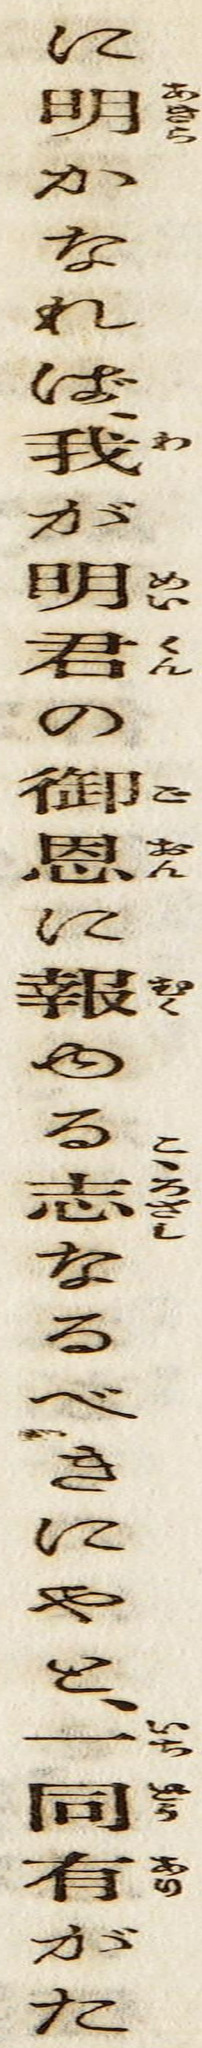に明かなれば、我が明君の御恩に報ゆる志なるべきにやと、一同有がた
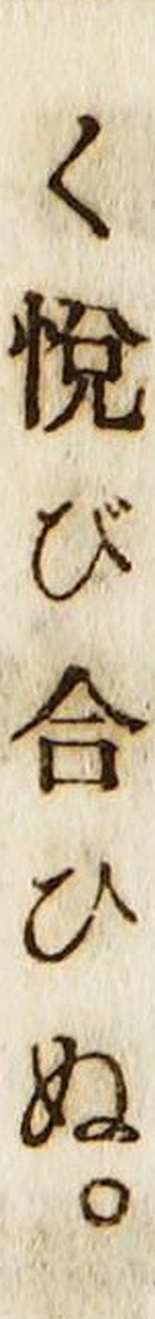く悦び合ひぬ。
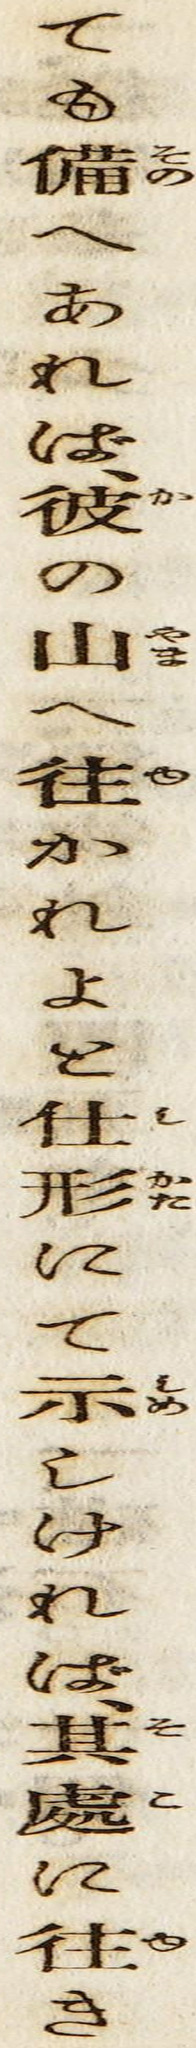ても備へあれば、彼の山へ往かれよと仕形にて示しければ、其処に往き
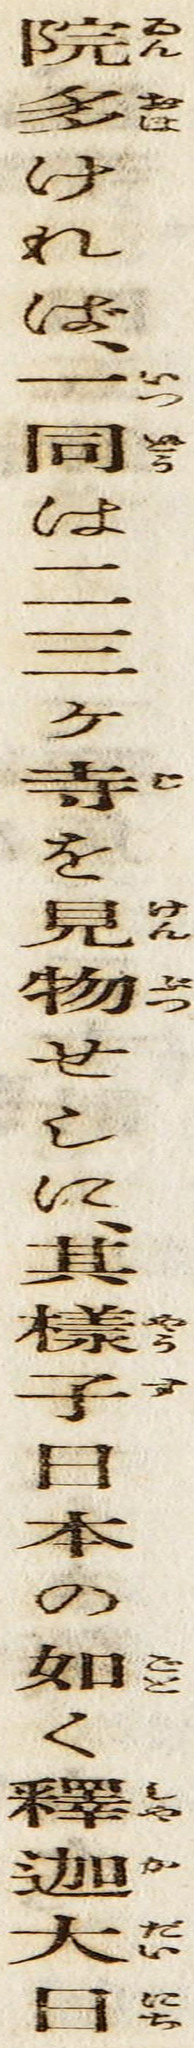院多ければ、一同は二三ケ寺を見物せしに、其様子日本の如く釈迦大日
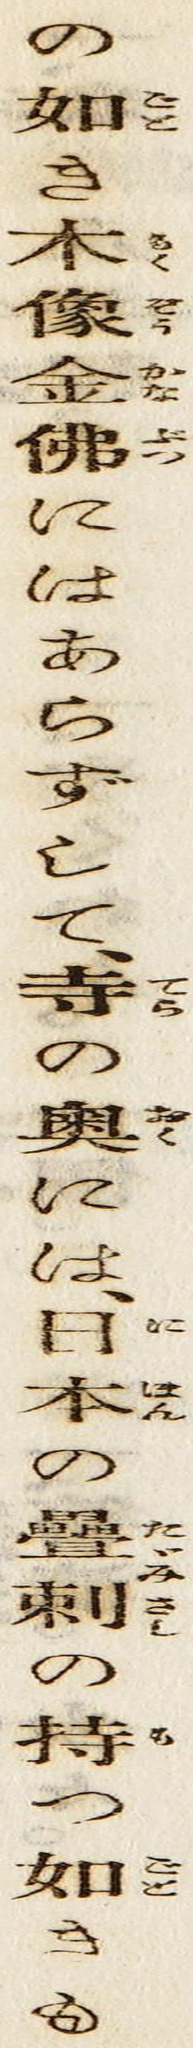の如き木像金仏にはあらずして、寺の奥には、日本の畳剌の持つ如きも
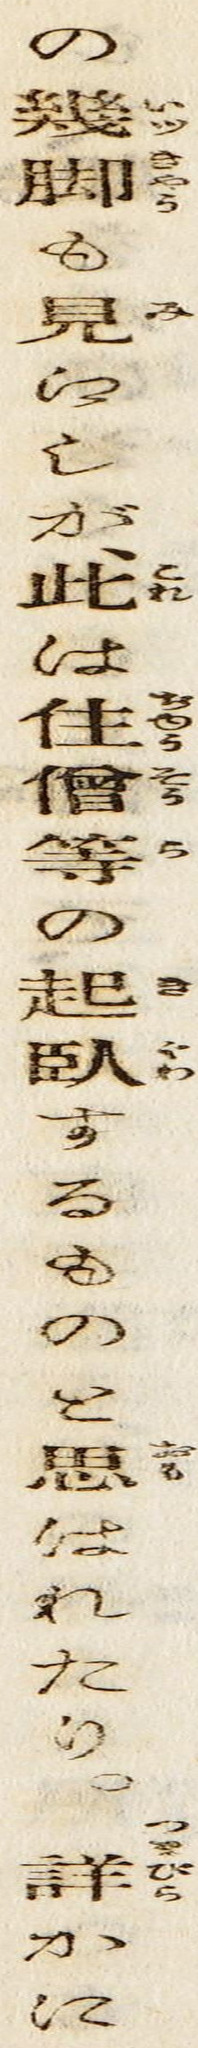の幾脚も見えしが、此は住僧等の起臥するものと思はれたり。詳かに
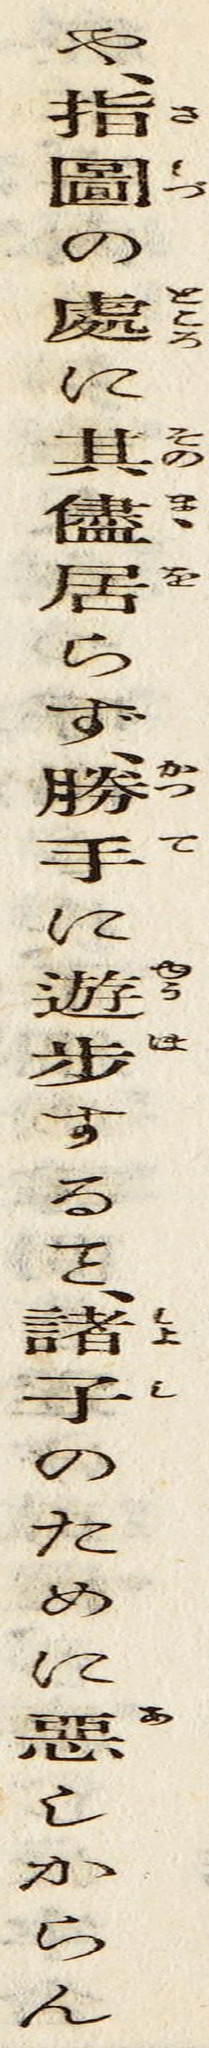や、指図の処に其儘居らず、勝手に遊歩すること、諸子のために悪しからん
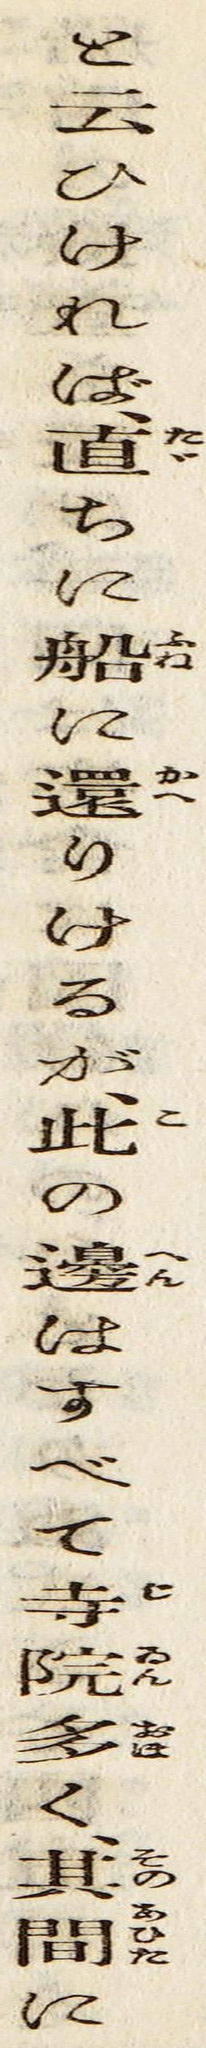と云ひければ、直ちに船に還りけるが、此の辺はすべて寺院多く、其間に
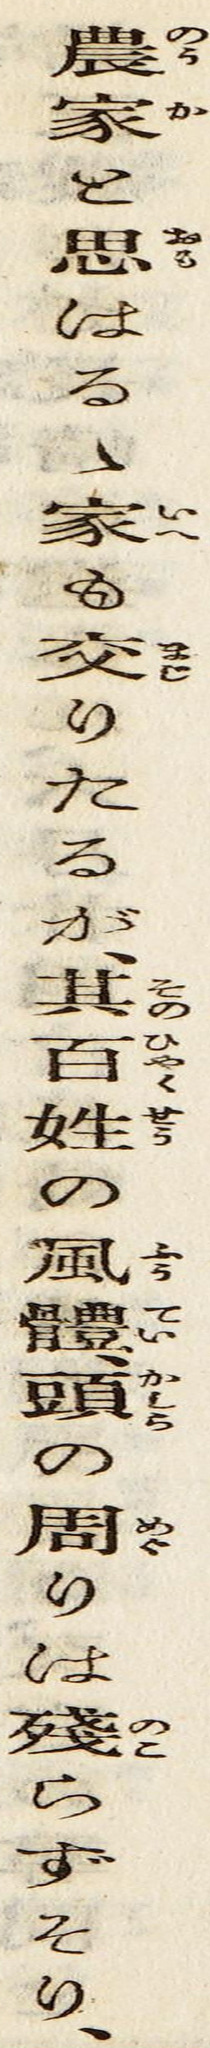農家と思はるゝ家も交りたるが、其百姓の風体、頭の周りは残らずそり、
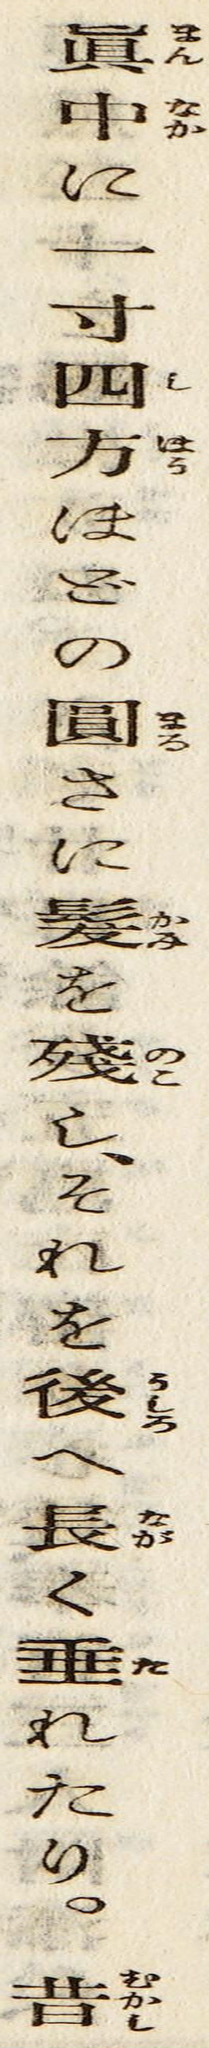真中に一寸四方ほどの円さに髪を残し、それを後へ長く垂れたり。昔
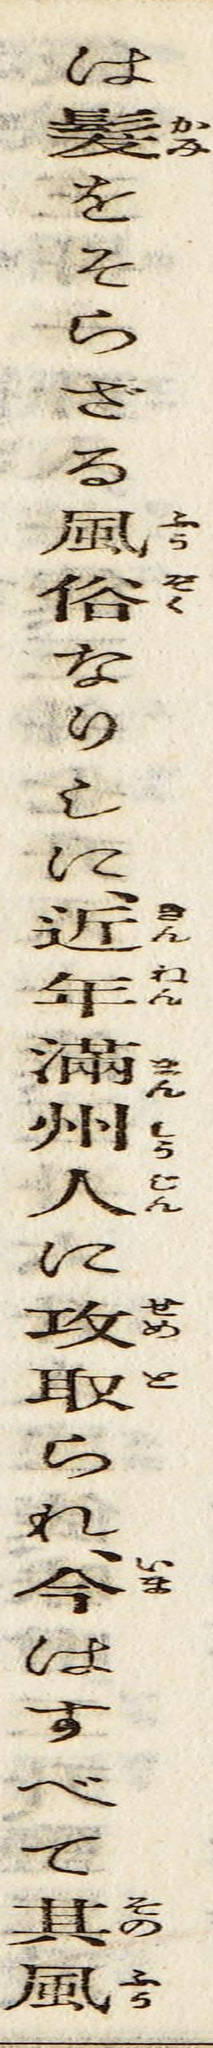は髪をそらざる風俗なりしに、近年満州人に攻取られ、今はすべて其風
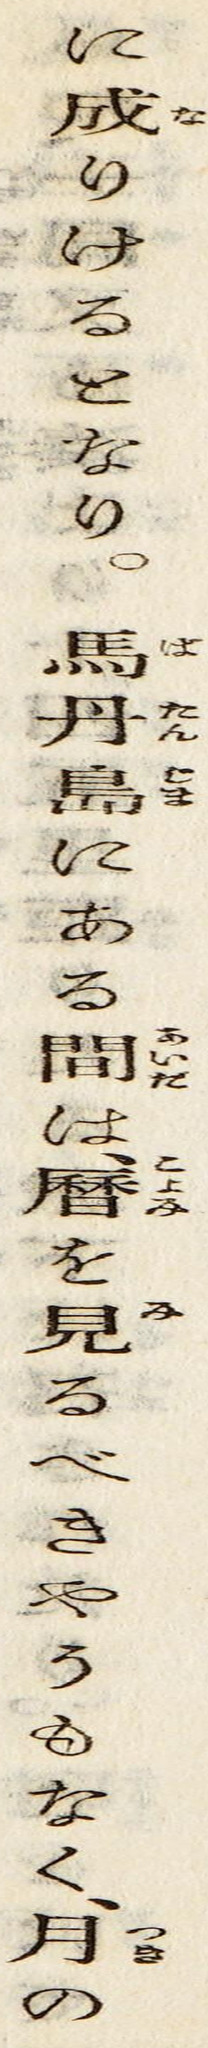に成りけるとなり。馬丹島にある間は、暦を見るべきやうもなく、月の
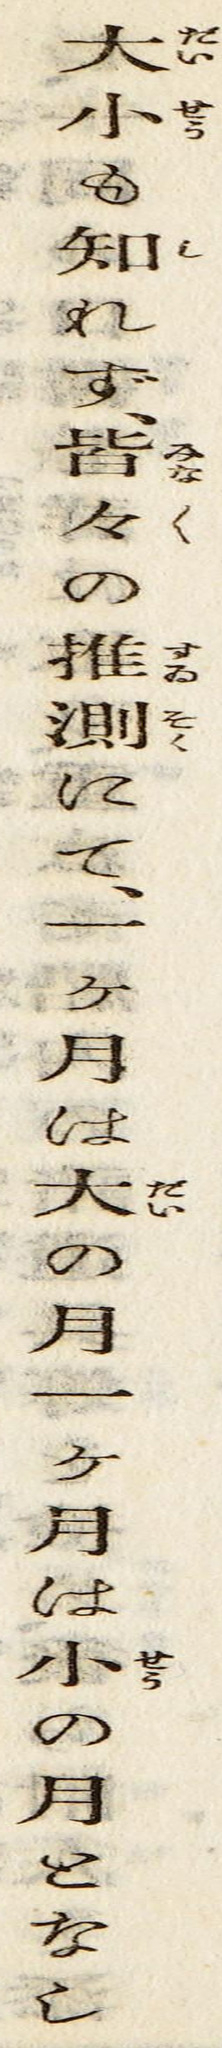大小も知れず、皆々の推測にて、一ケ月は大の月一ケ月は小の月となし
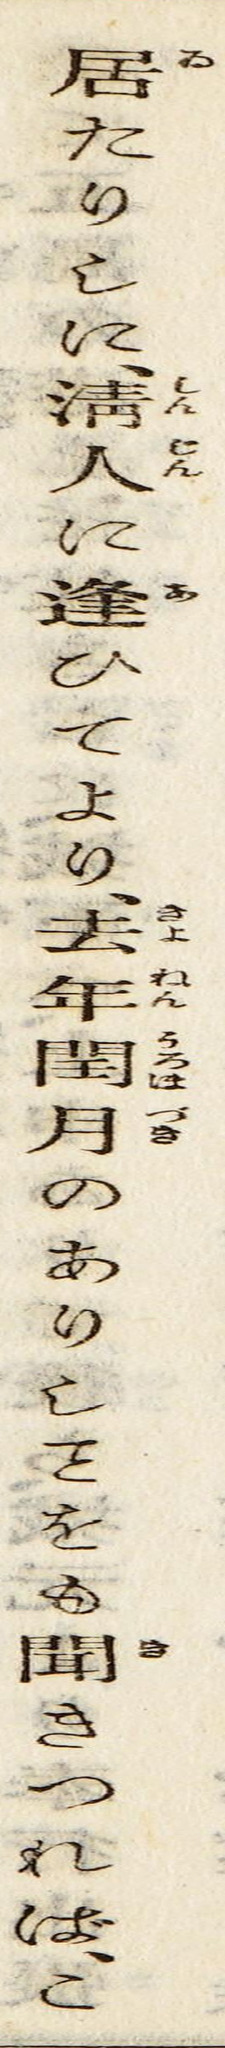居たりしに、清人に逢ひてより、去年閏月のありしことをも聞きつれば、こ
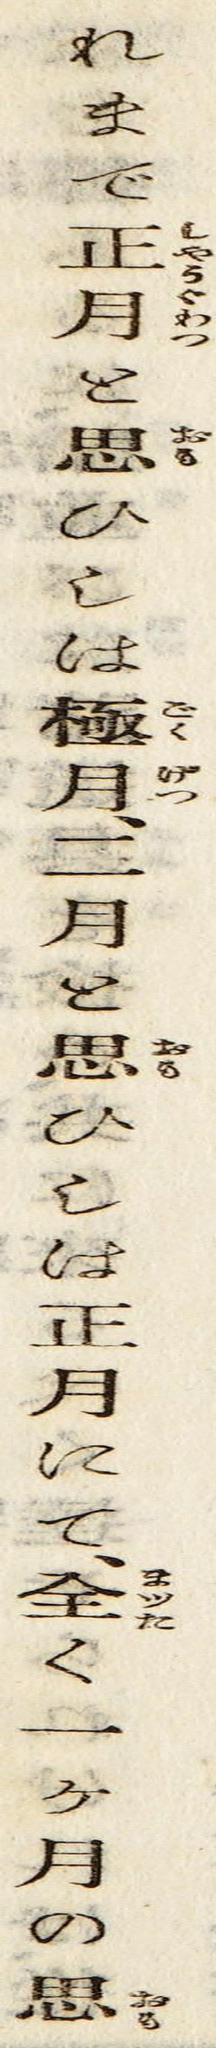れまで正月と思ひしは極月、二月と思ひしは正月にて、全く一ケ月の思
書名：日本漂流譚
